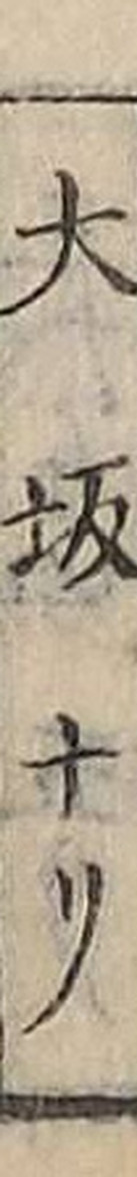大坂十リ
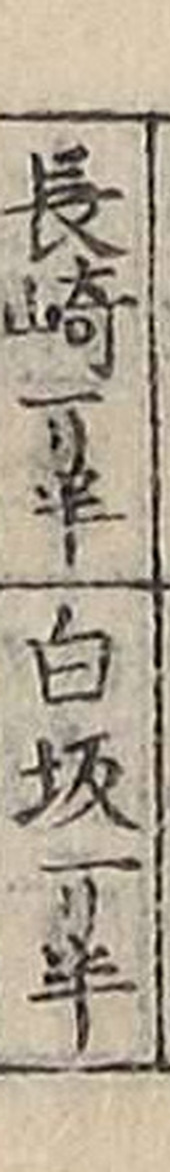長崎一リ半白坂一リ半
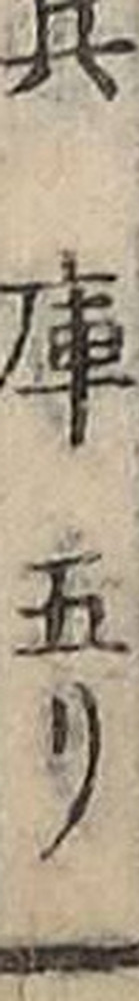兵庫五リ
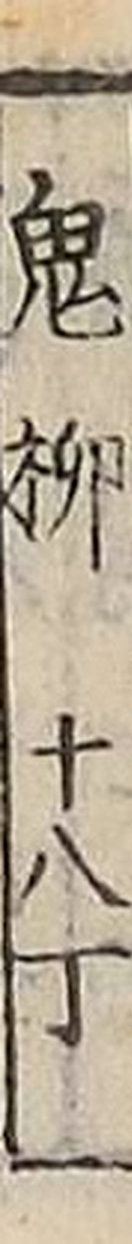鬼柳十八丁
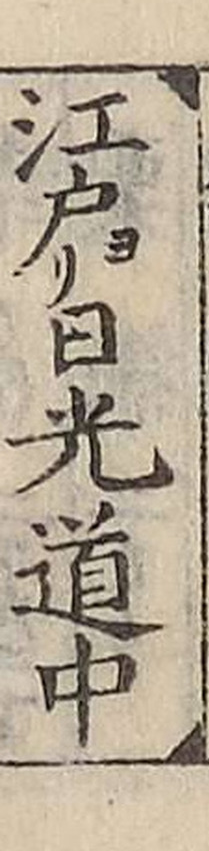江戸ヨリ日光道中
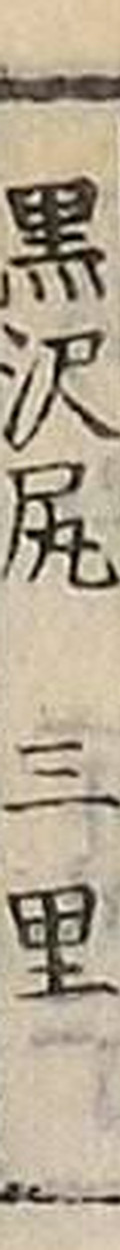黒沢尻三里
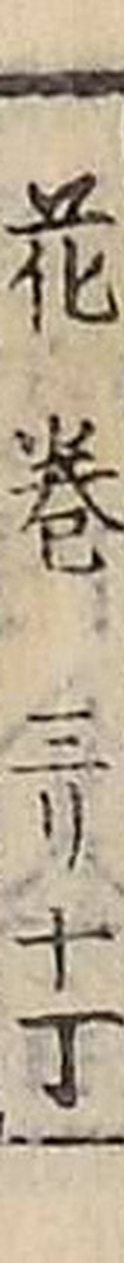花巻三リ十丁
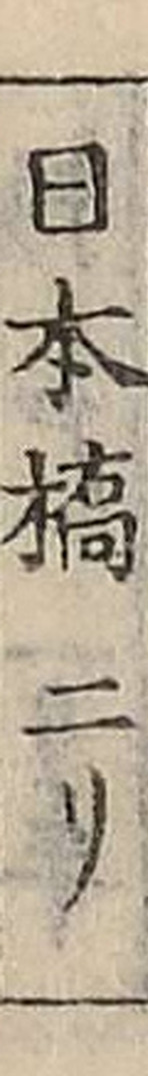日本橋二リ
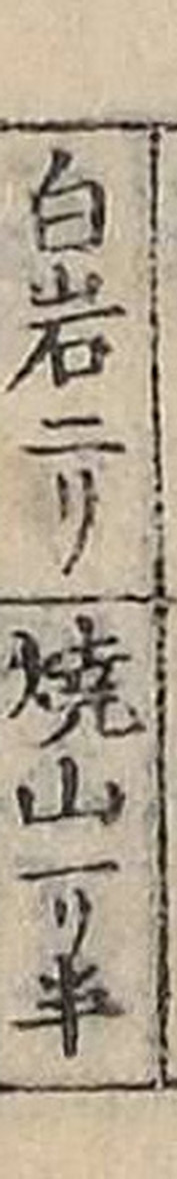白岩二リ焼山一リ半
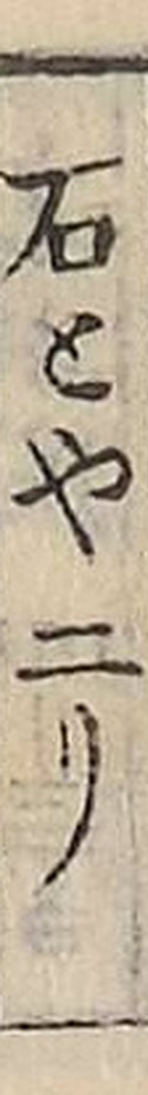石とや二リ
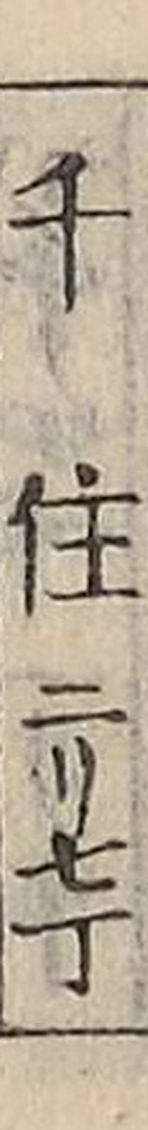千住二リ七丁
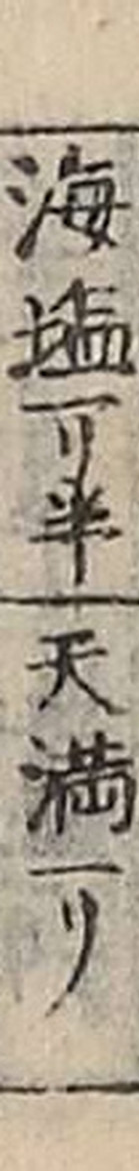海塩一リ半天満一リ
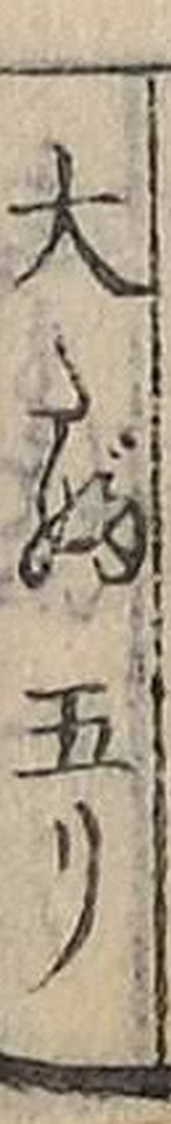大たぶ五リ
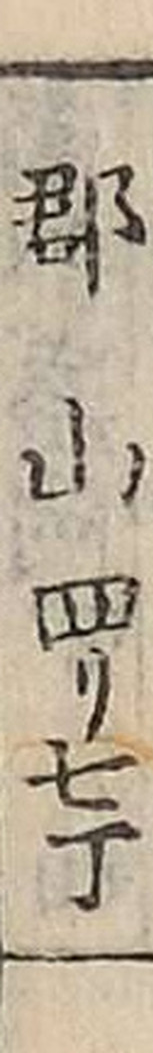郡山四リ七丁
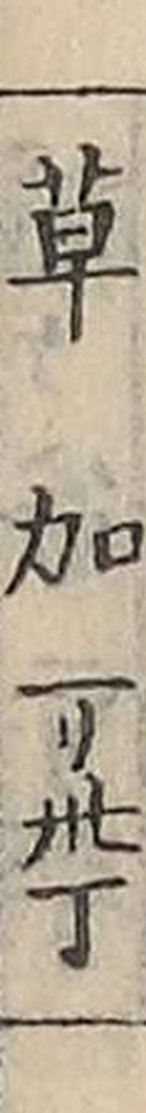草加一リ卅丁
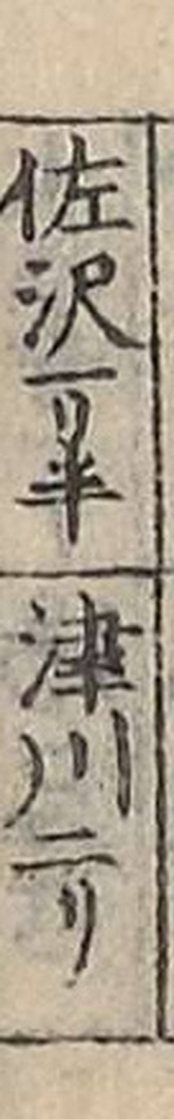佐敷四リ半
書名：旅行用心集
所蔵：神戸大学附属図書館 国文学研究資料館
